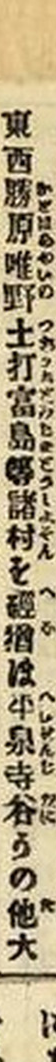東西勝原唯野土打富島等諸村を經猶ほ平泉寺谷その他大
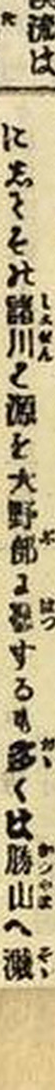にしてその諸川は源を大野部に發するも多くは勝山へ灌
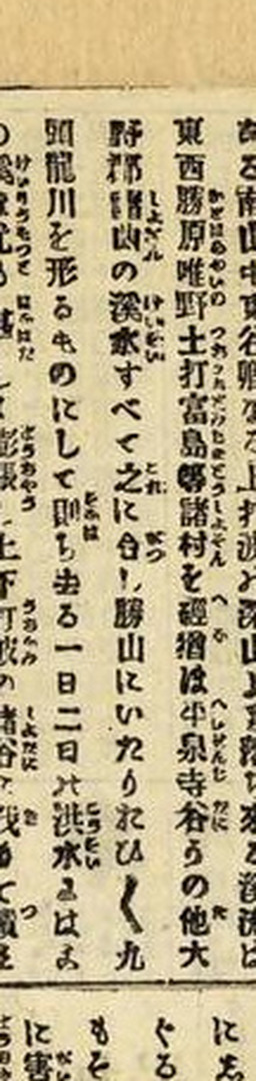野郡諸山の溪水すべて之に合し勝山にいたりたひ〳〵九
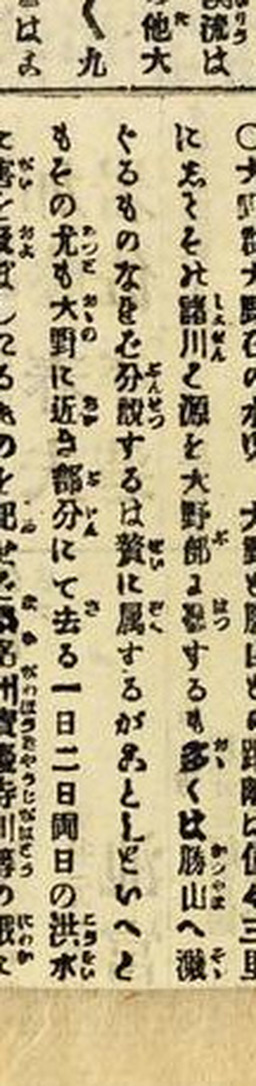ぐるものなれば分説するは贅に属するがことしといへと
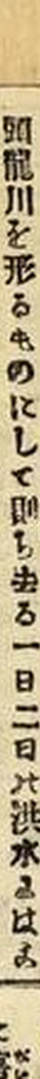頭龍川を形るものにして則ち去る一日二日の洪水にはこ
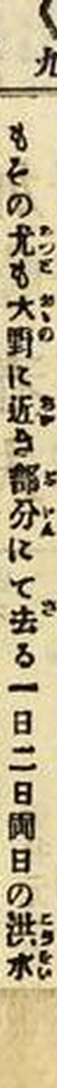もその尤も大野に近き部分にて去る一日二日兩日の洪水
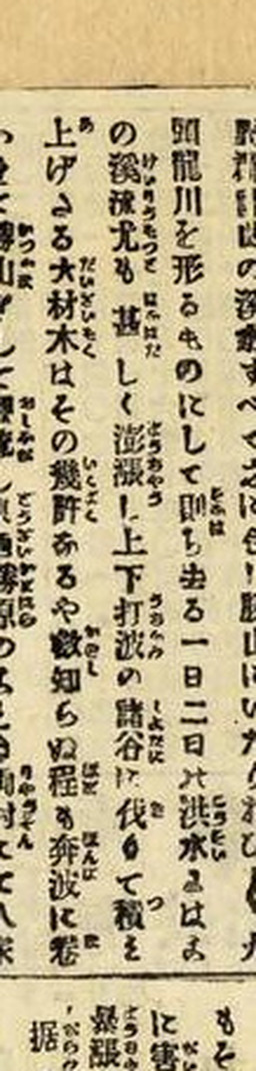の溪流尤も甚しく澎漲し上下打波の諸谷に伐りて積み
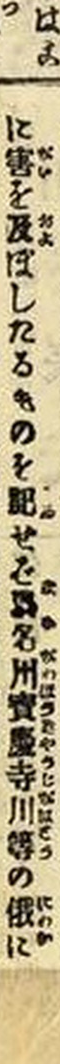に害を及ぼしたるものを肥せば眞名川寶慶寺川等の俄に
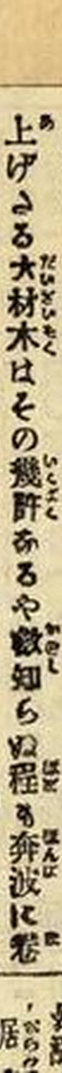上げたる大材木はその幾許なるや數知らぬ程も奔波に巻
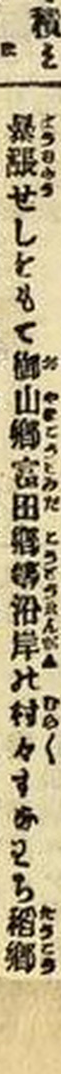暴漲せしをもて御山鄕富田鄕等沿岸の村々すなわち稻鄕
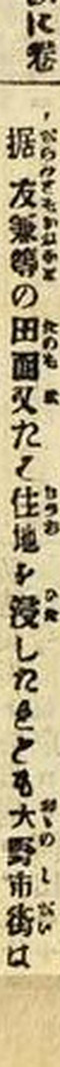据友兼等の田面又たは住地を浸したれとも大野市街は
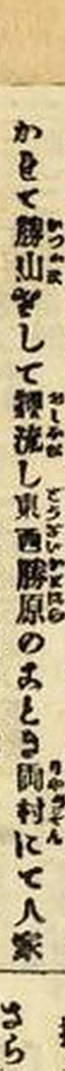かれて勝山をして押流し東西勝原のことき兩村にて人家
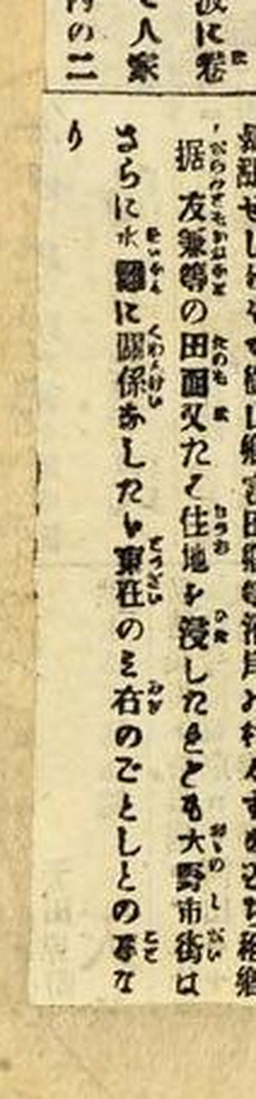さらに水難に關係なしたゞ東在のみ右のごとしとの事な
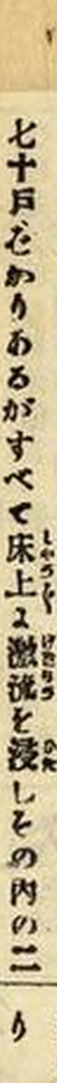七十戸ばかりあるがすべて床上に激流を浸しその内の二

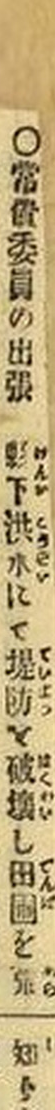○常置委員の出張縣下洪水にて堤防を破壊し田圃を荒
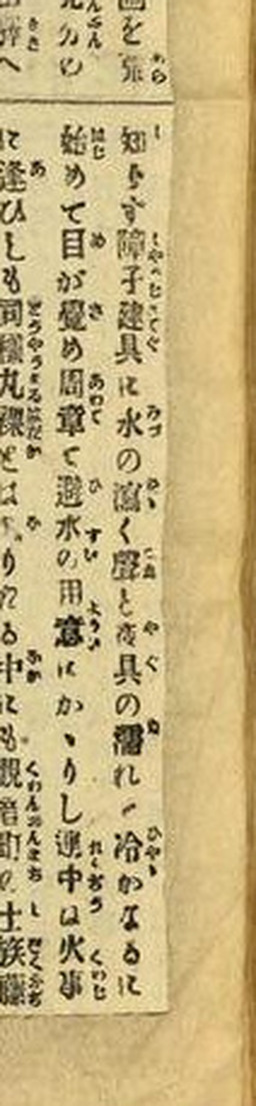知らす障子建具に水の瀉く聲と夜具の濡れて冷かなるに
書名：温古集 五巻
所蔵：福井県文書館 Fukui Prefectural Archives
